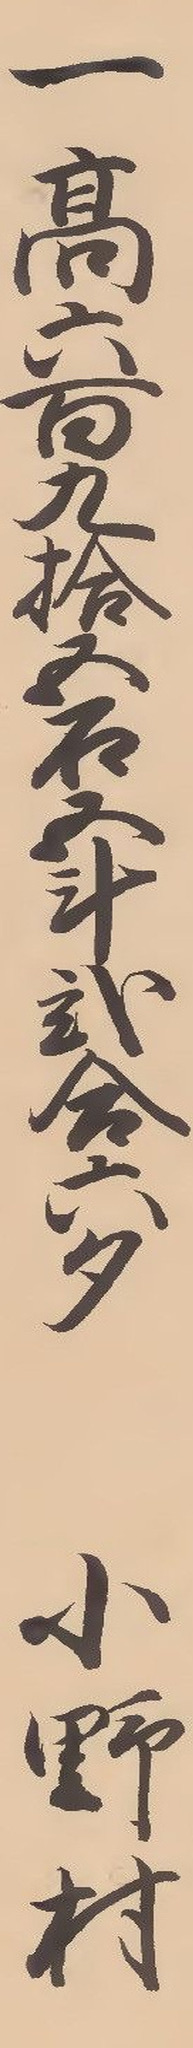一高六百九拾五石五斗弐合六勺小野村
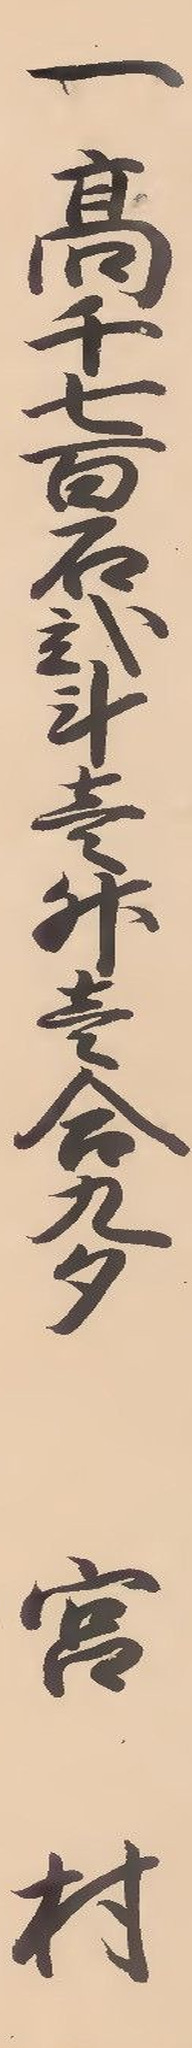一高千七百石弐斗壱升壱合九勺宮村
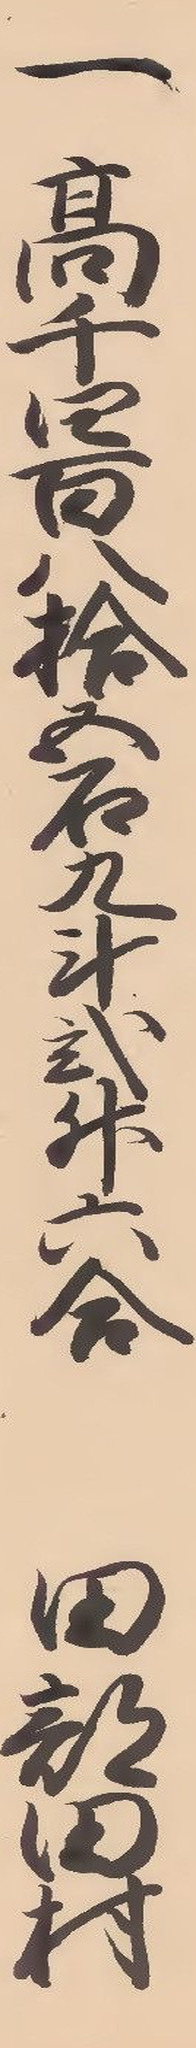一高千四百八拾五石九斗弐升六合田部田村
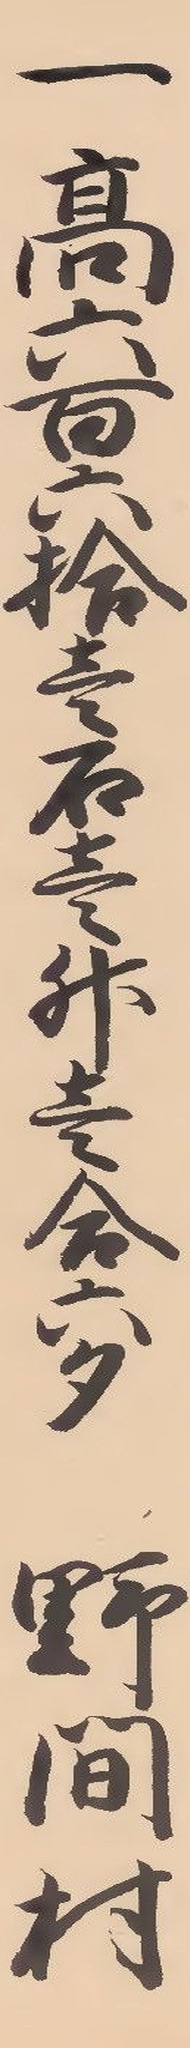一高六百六拾壱石壱升壱合六勺野間村
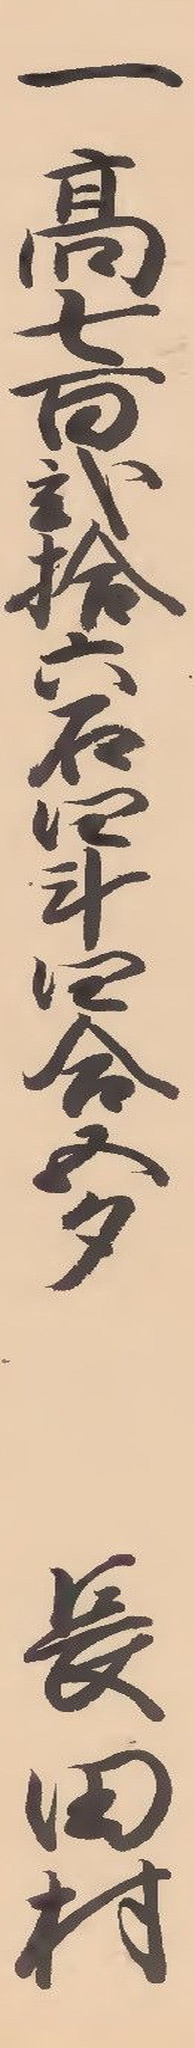一高七百弐拾六石四斗四合五勺長田村

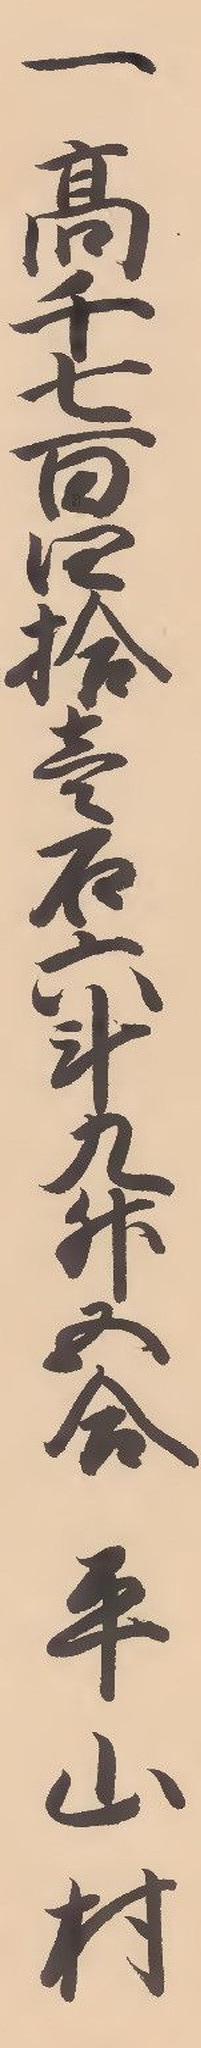一高千七百四拾壱石六斗九升五合平山村
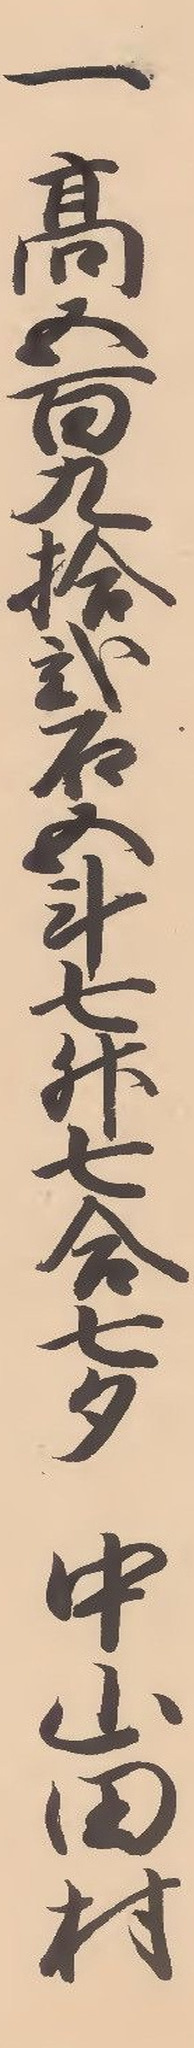一高五百九拾弐石五斗七升七合七勺中山田村
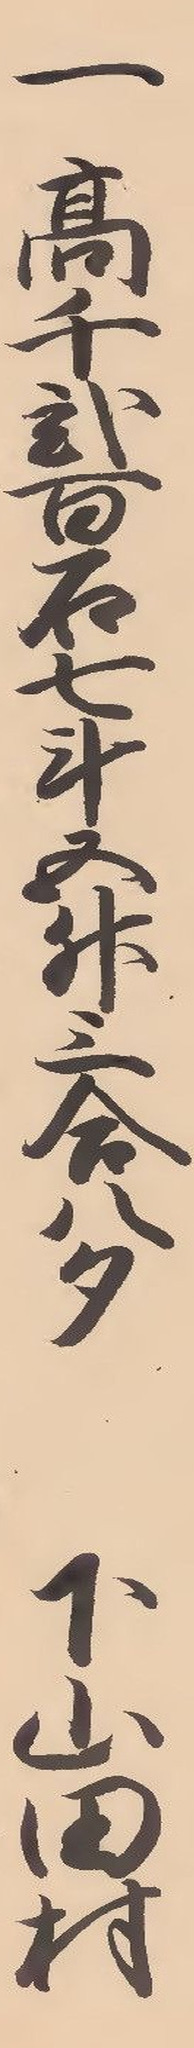一高千弐百石七斗五升三合八勺下山田村
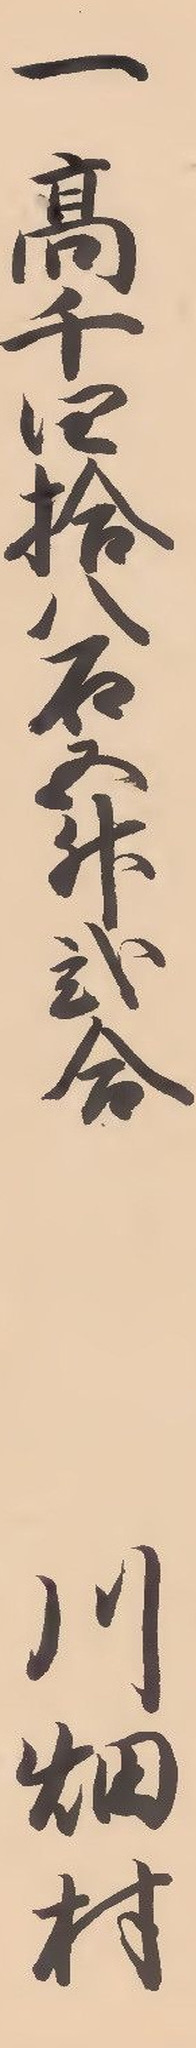一高千四拾八石五升弐合川畑村
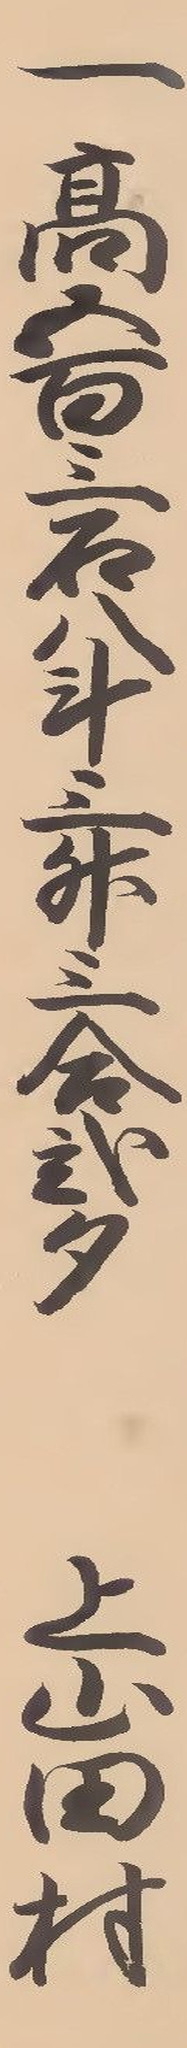一高五百三石八斗三升三合弐勺上山田村
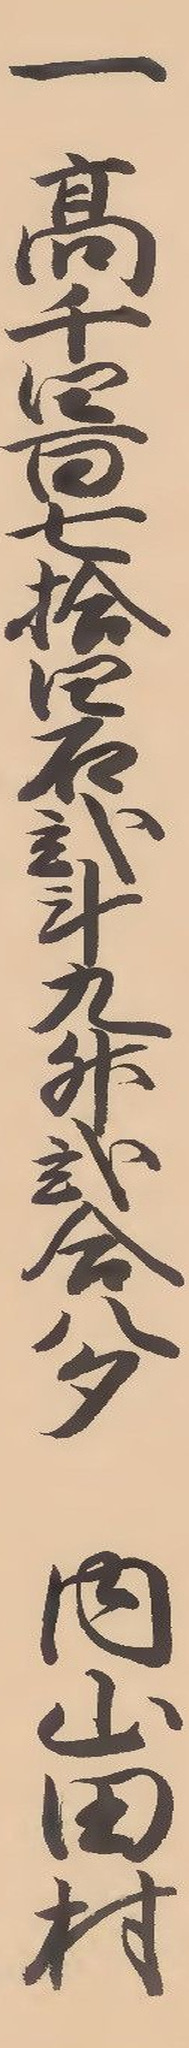一高千四百七拾四石弐斗九升弐合八勺内山田村
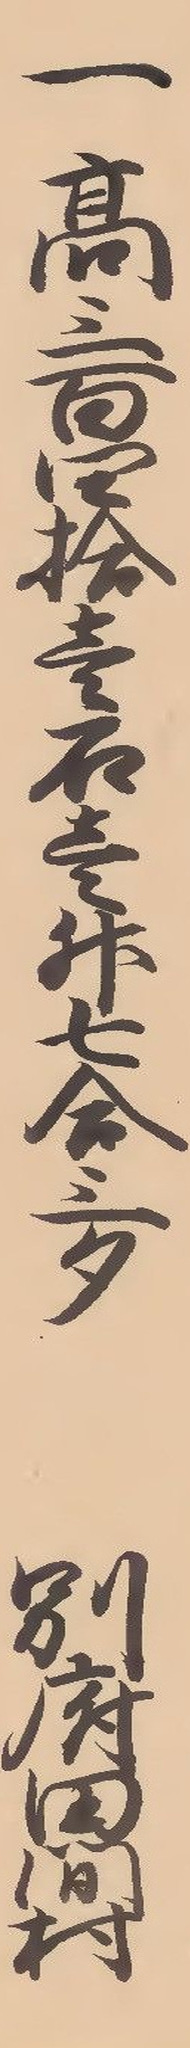一高三百四拾壱石壱升七合三勺別府田間村
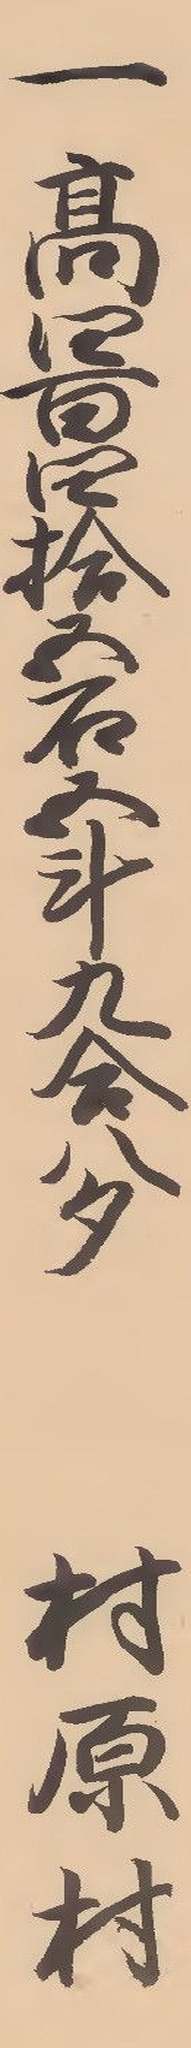一高四百四拾五石五斗九合八勺村原村

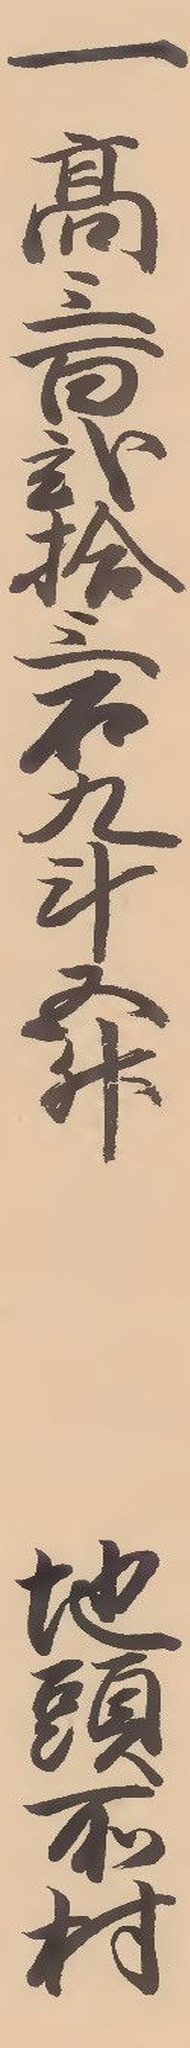一高三百弐拾三石九斗五升地頭所村
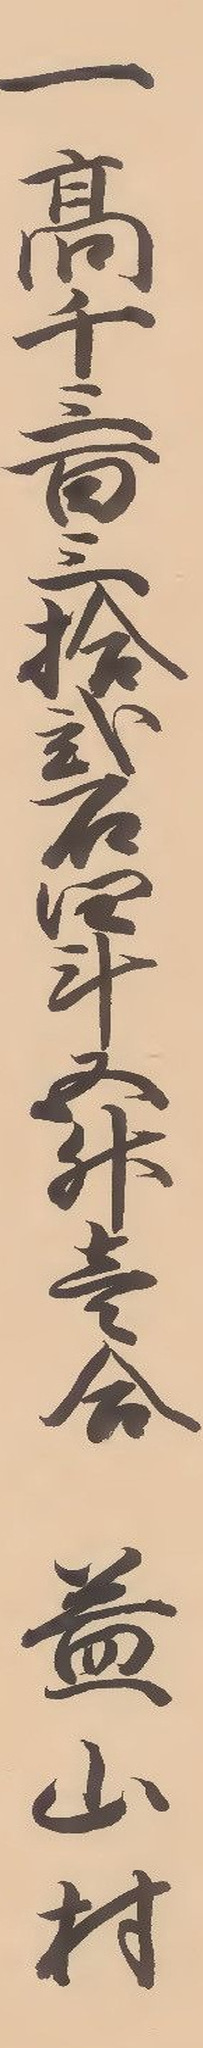一高千三百三拾弐石四斗五升壱合益山村
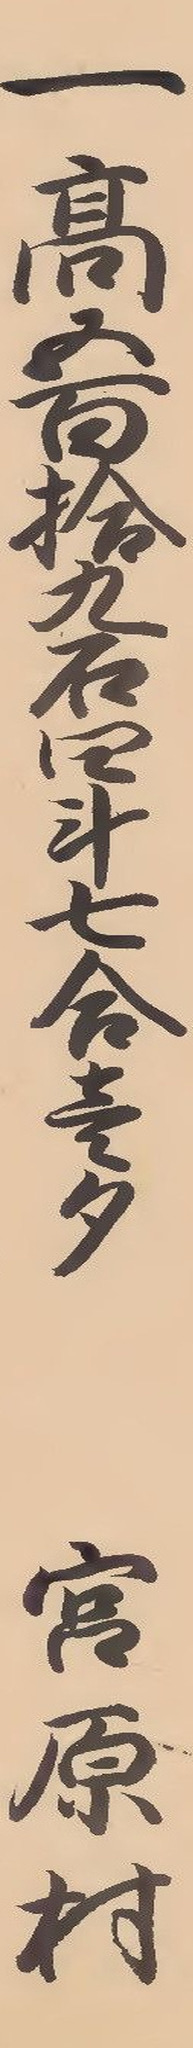一高五百拾九石四斗七合壱勺宮原村
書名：薩摩国郷帳
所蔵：国立公文書館 National Archives of Japan
